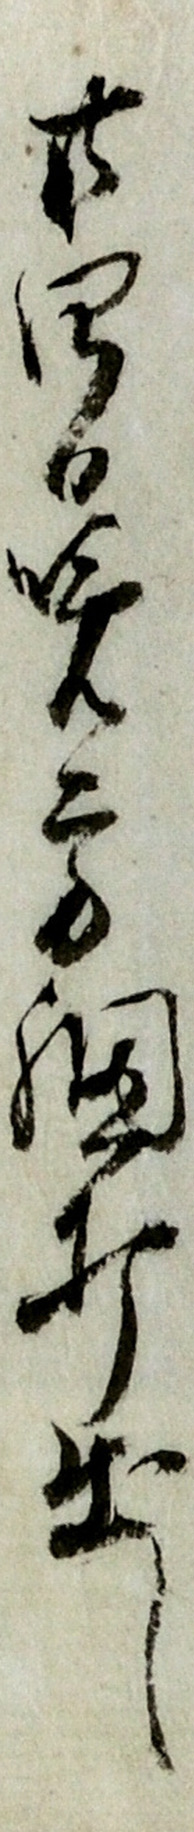廿四日晩方網打出し
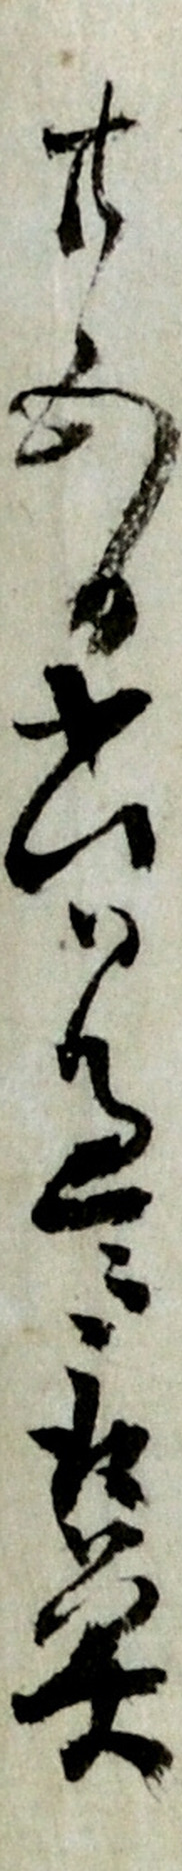廿五日六つ過ニ取魚

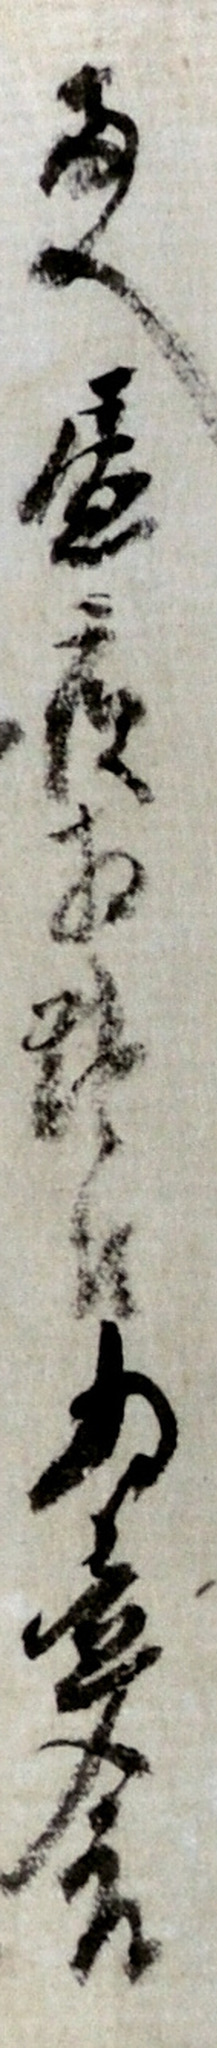両人昼夜相勤に付為立合
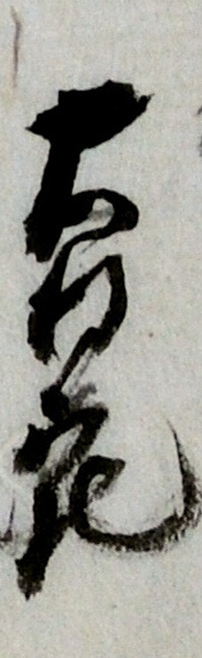右同断
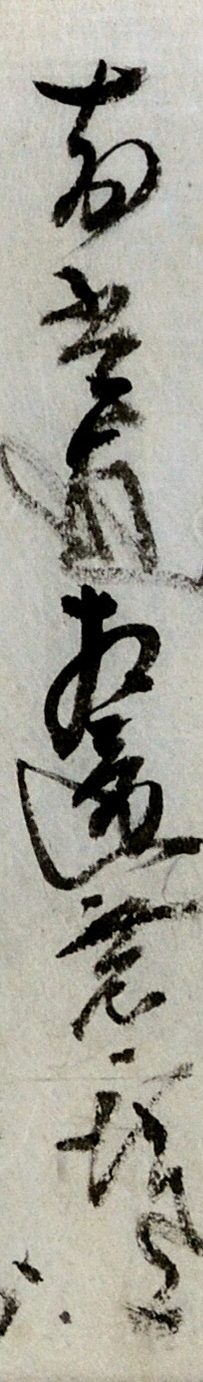前書之通相違無御座候以上
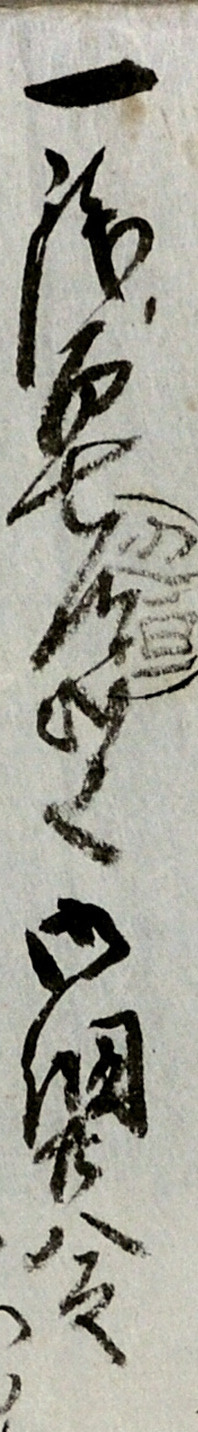一銭百七拾弐文御網廿八反
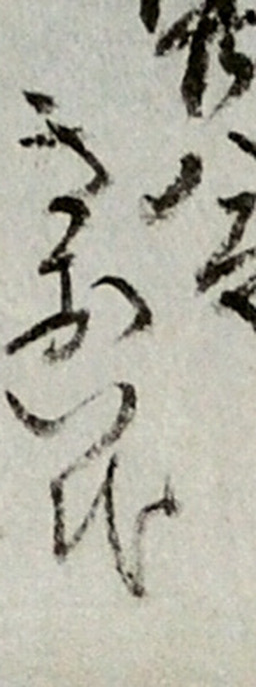きおい代
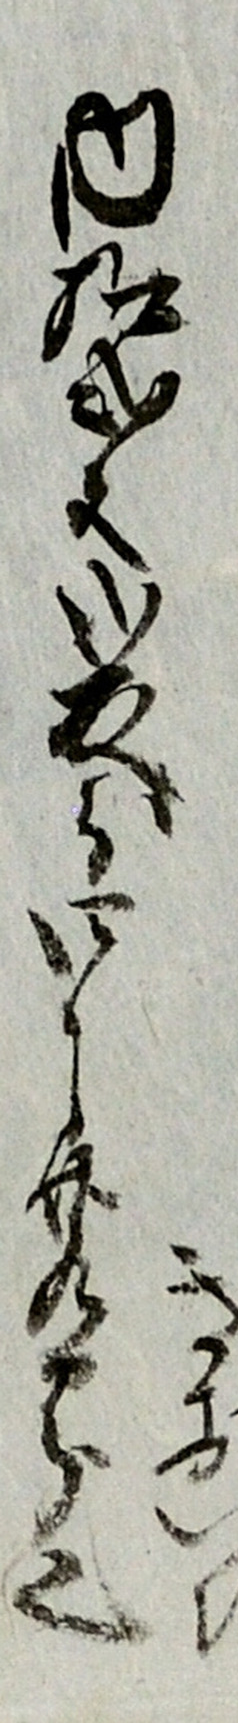内拾弐文弐反分四月廿九日分也
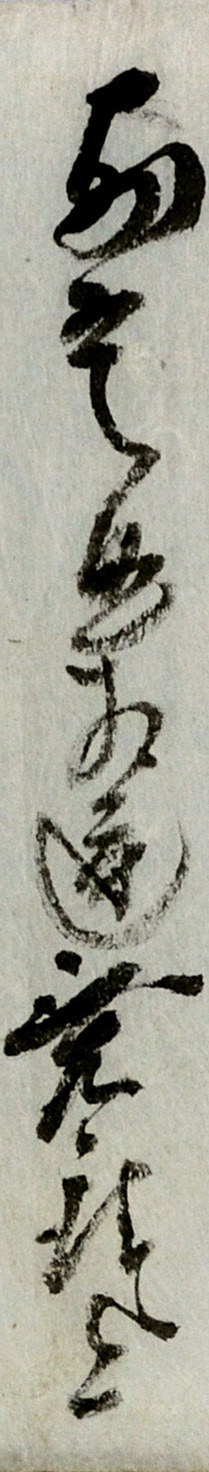西之通相違無御座候以上
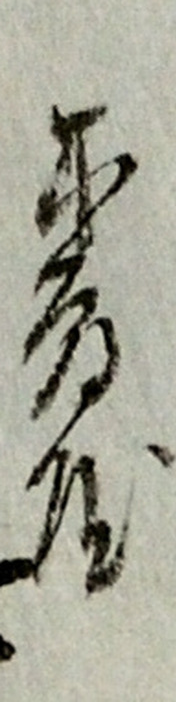木曽屋
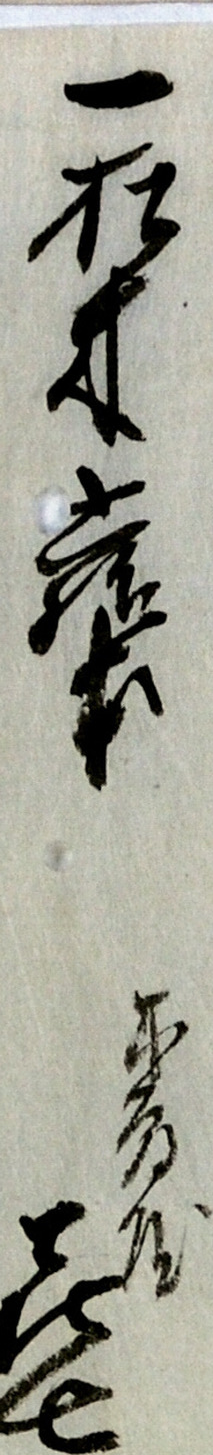一松木六拾本喜七
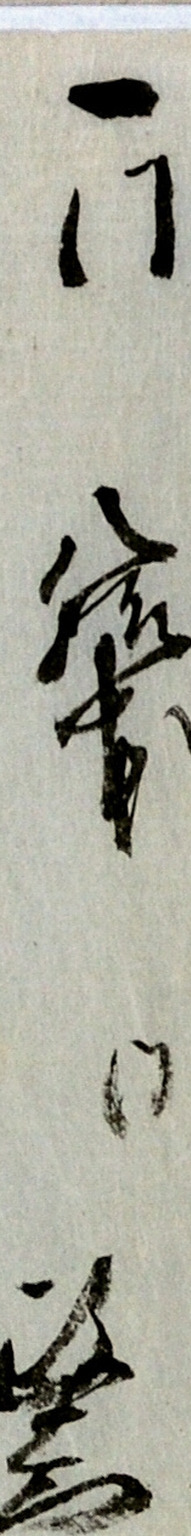一同八拾本政右衛門
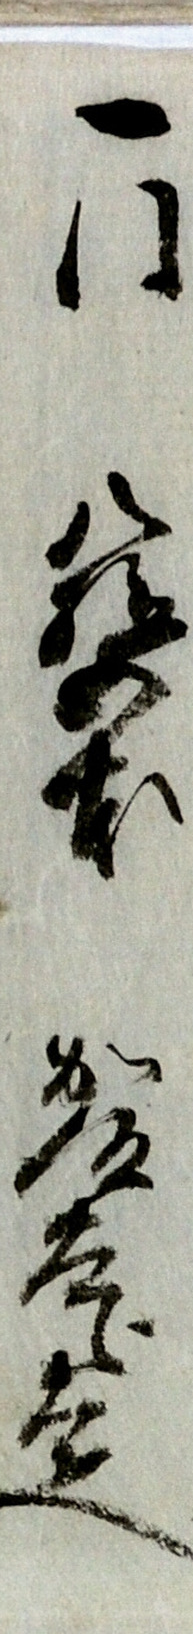一同八拾五本加藤太郎左衛門
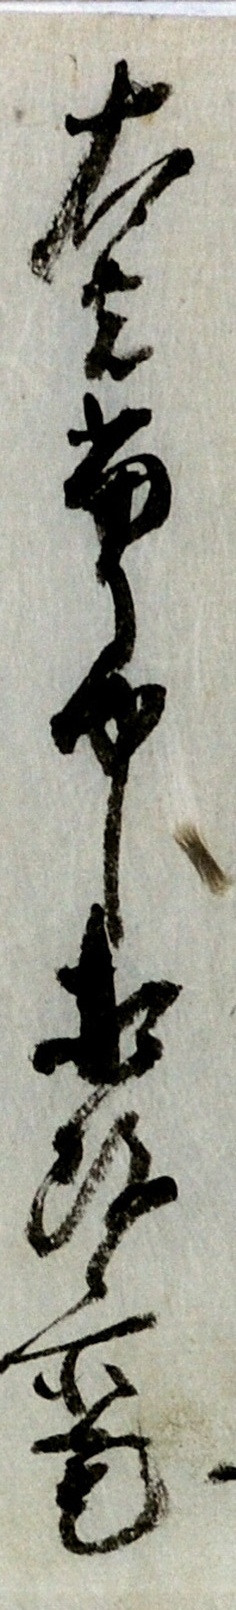右は当月中相改候所如是

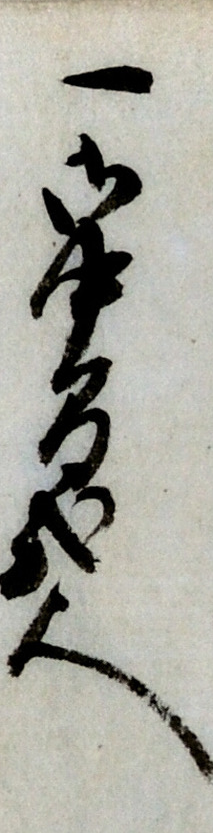一御中間弐人
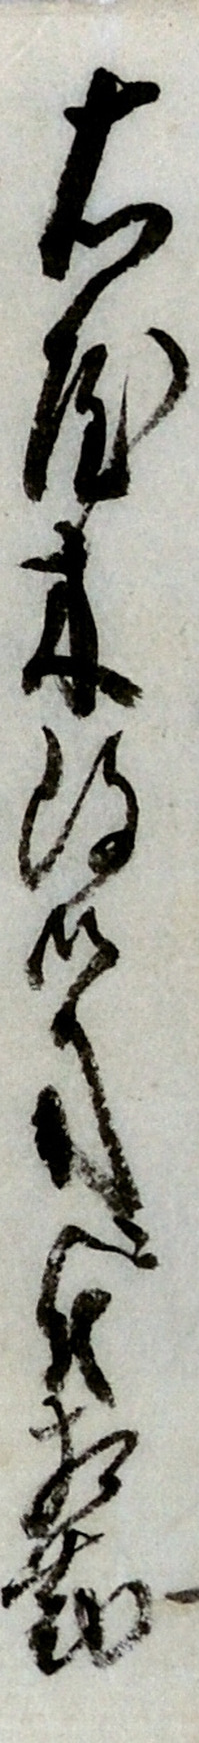右屋木改御用に付相勤
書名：分一方諸事御用留帳
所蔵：伊那市立高遠町図書館・合同会社AMANE
